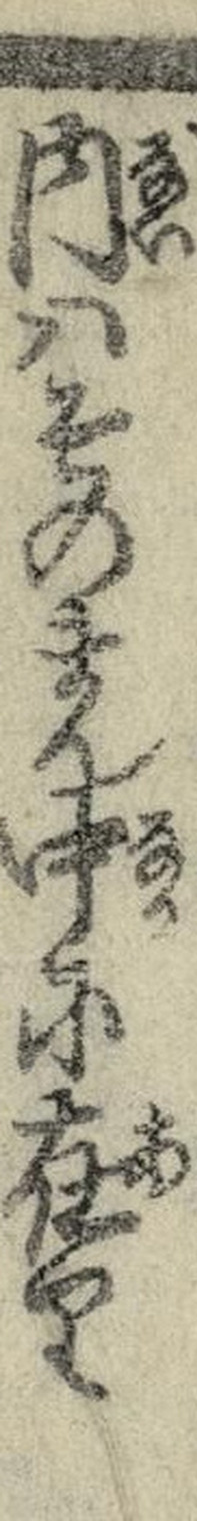内ハそのまん中に在り
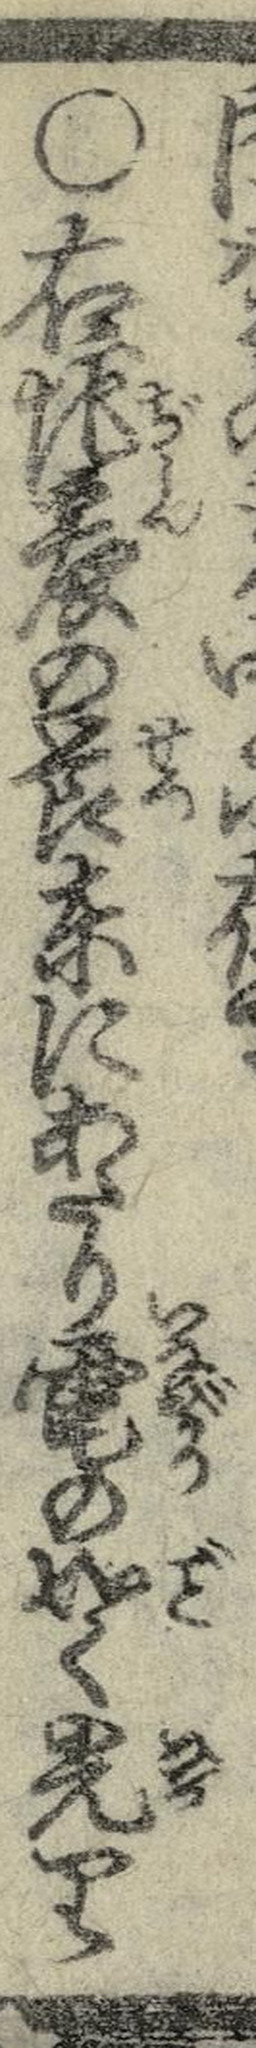○右地震の節東にあたり雷の如く光り
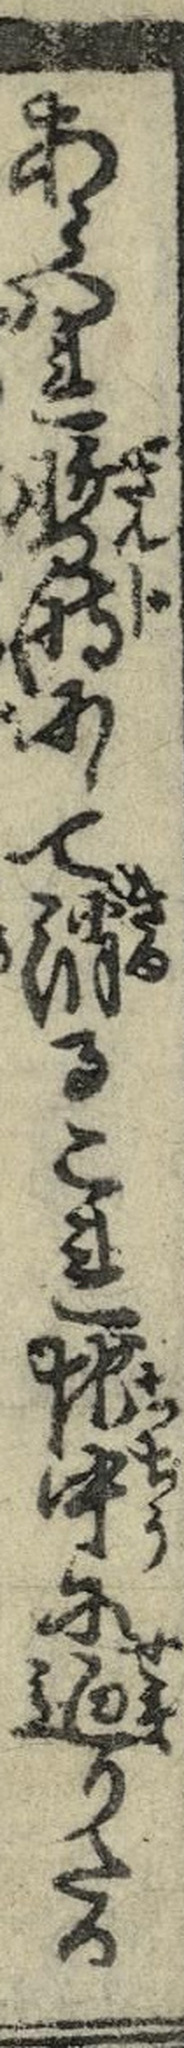あらハれ暫時にて消るこれ地中に迫りたる
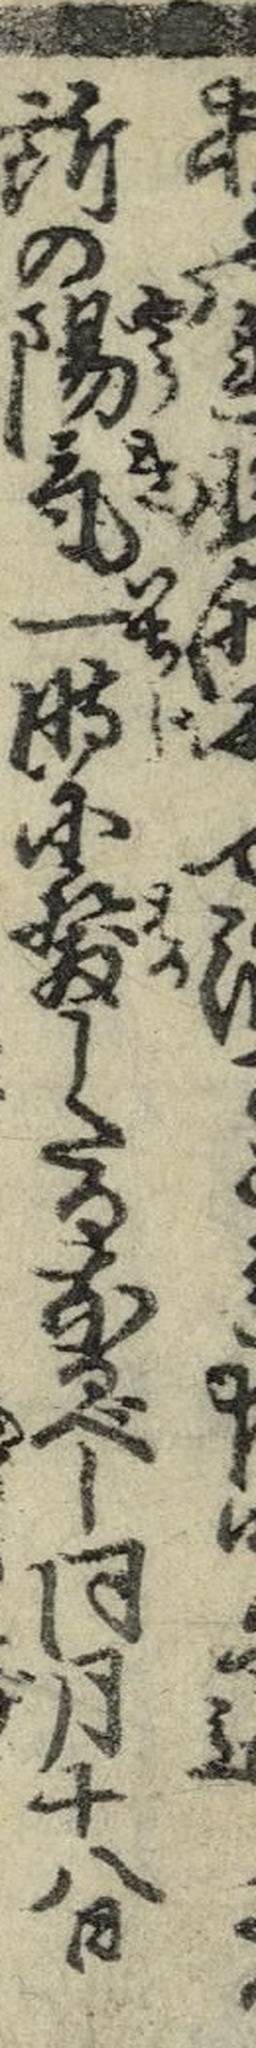所の陽気一時に發したるなるべし同月十八日
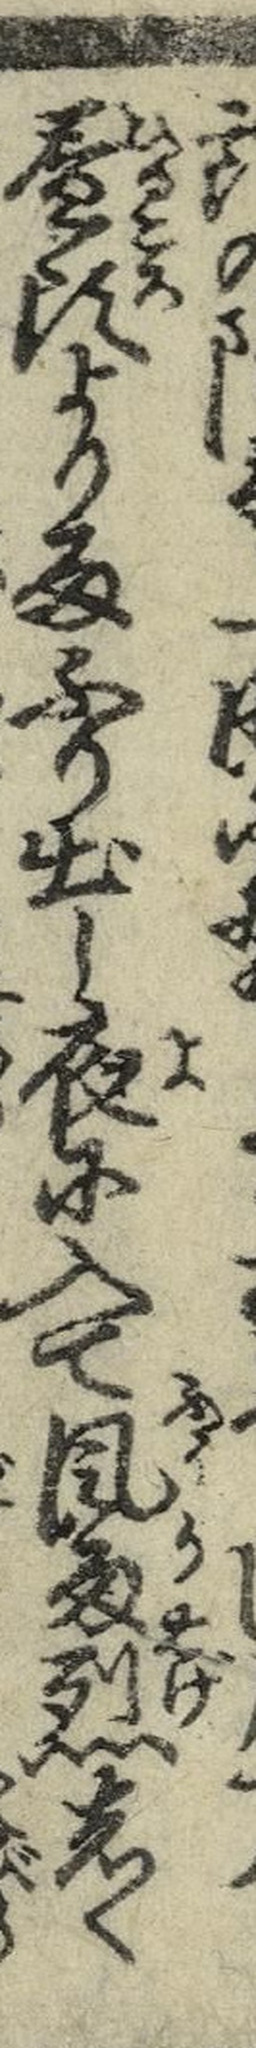昼比より雨ふり出し夜に入て風雨烈しく
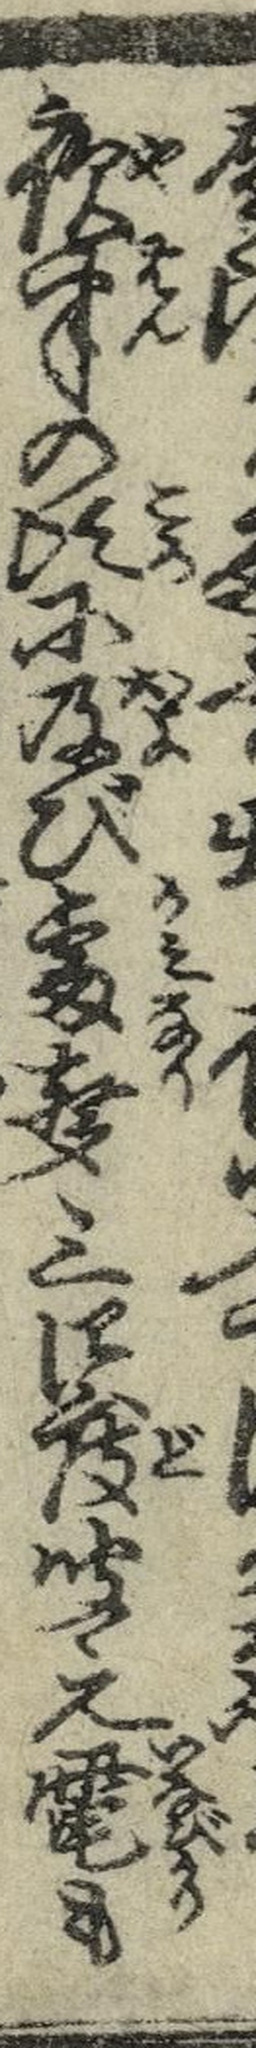夜半の比に及び雷声三四度聞え電も
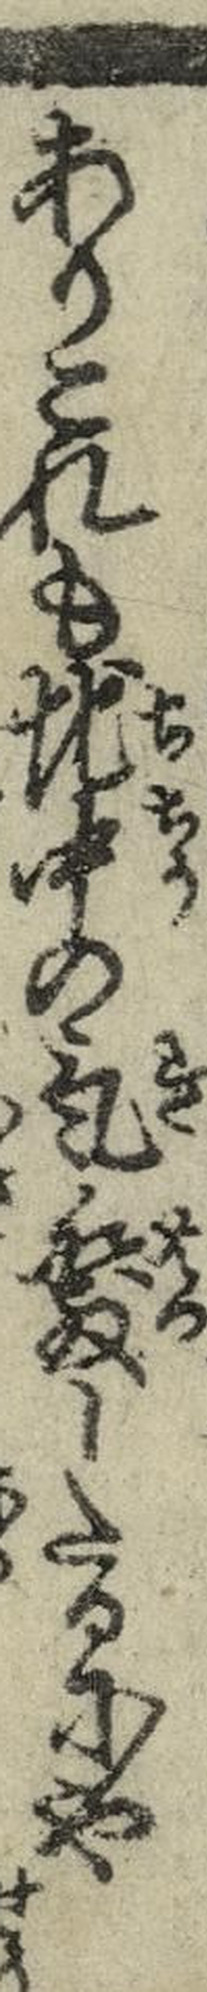ありこれも地中の気發したるにや
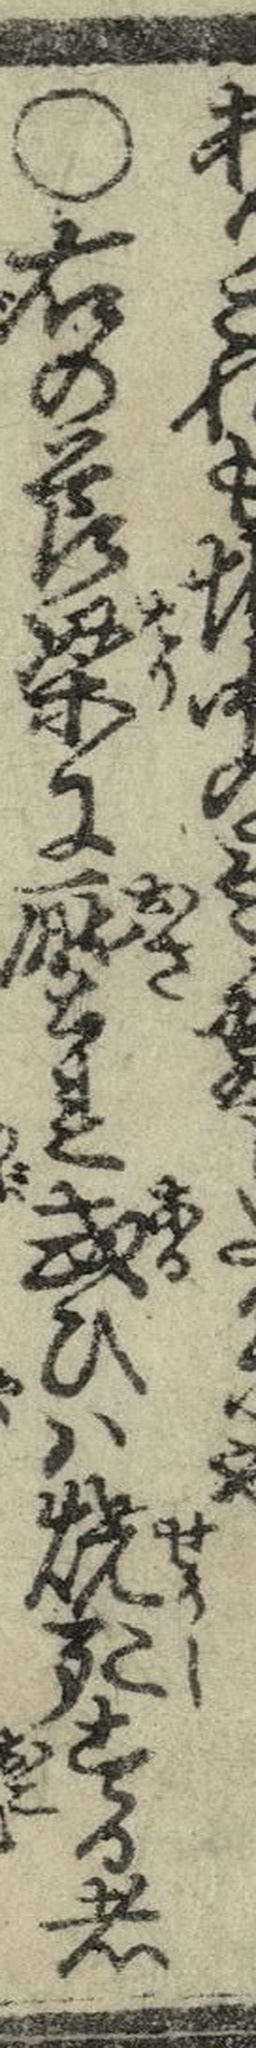○右の節梁に壓れ或ひは焼死する者
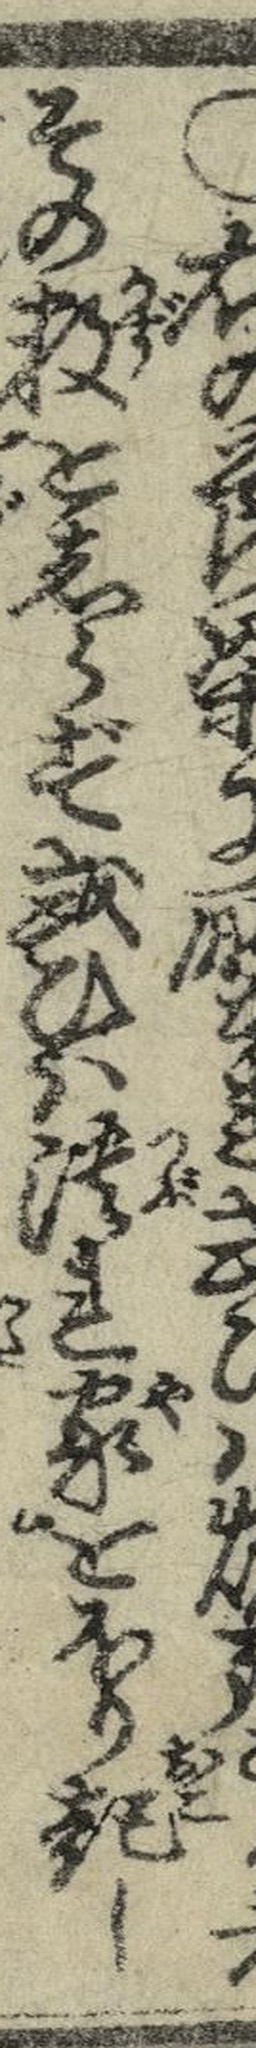その数をしらず或ひはハ潰れ家をほり起し
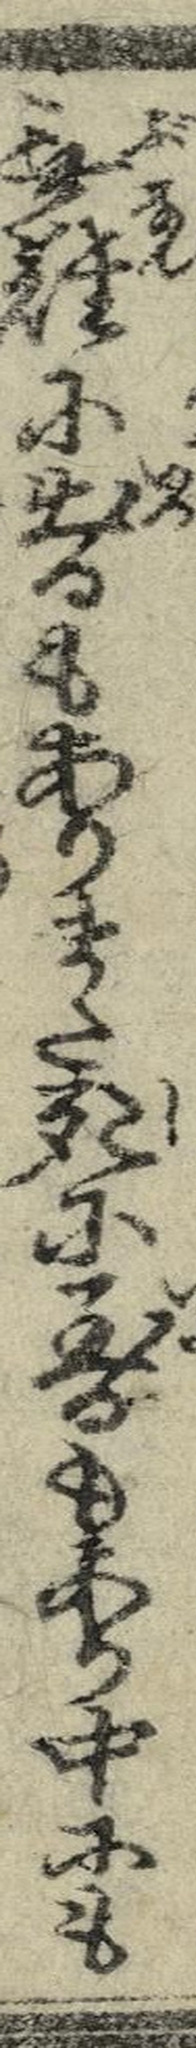無難に出るもありまた死に至るるもあり中にも
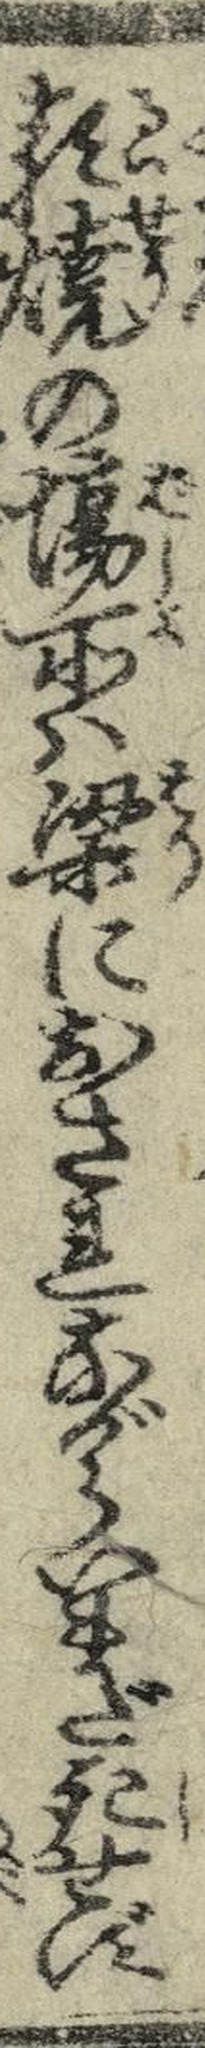類焼の場所ハ梁におされなされながらいまだ死せず
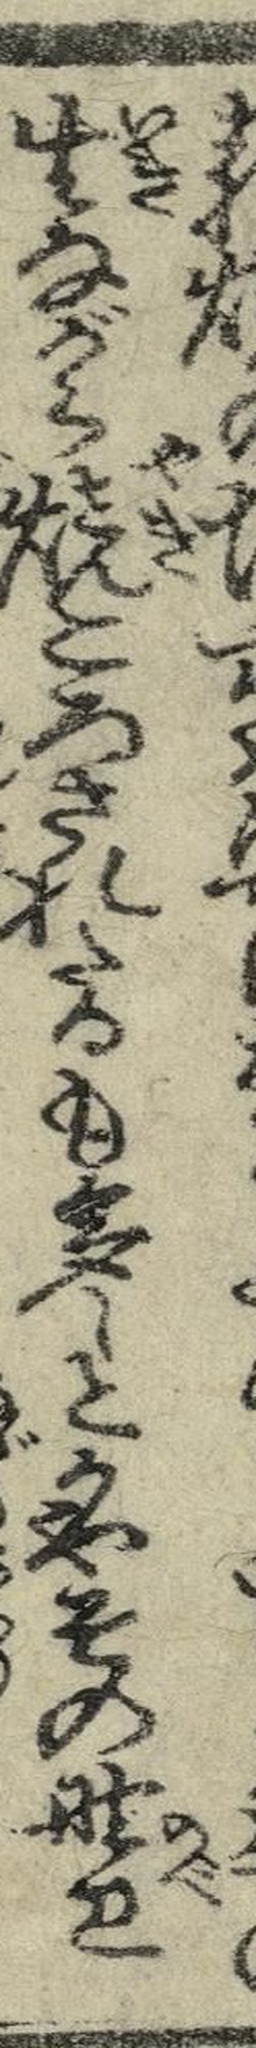生ながら焼ころされたるも多しとかやその野辺
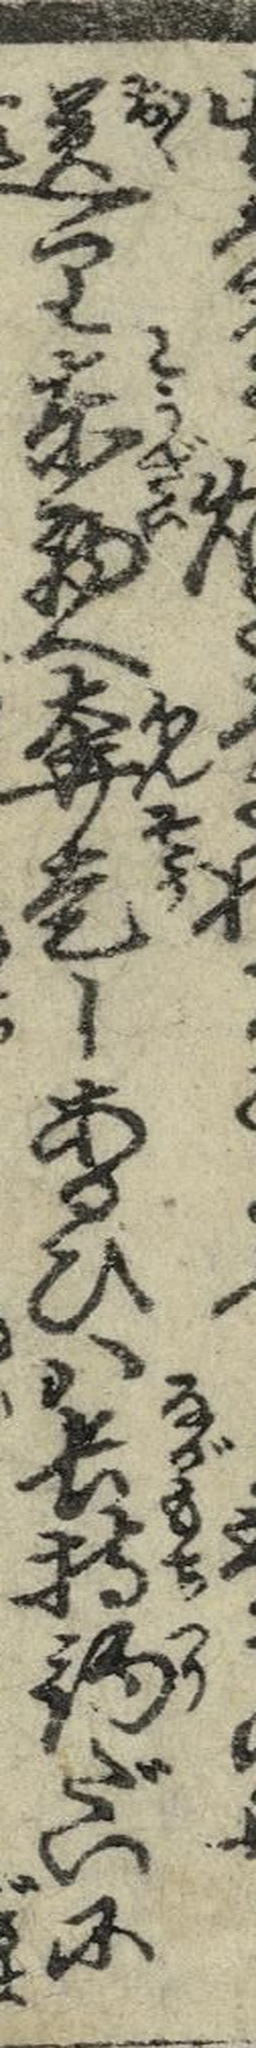送り東西へ奔走しあるひハ長持釣だいに
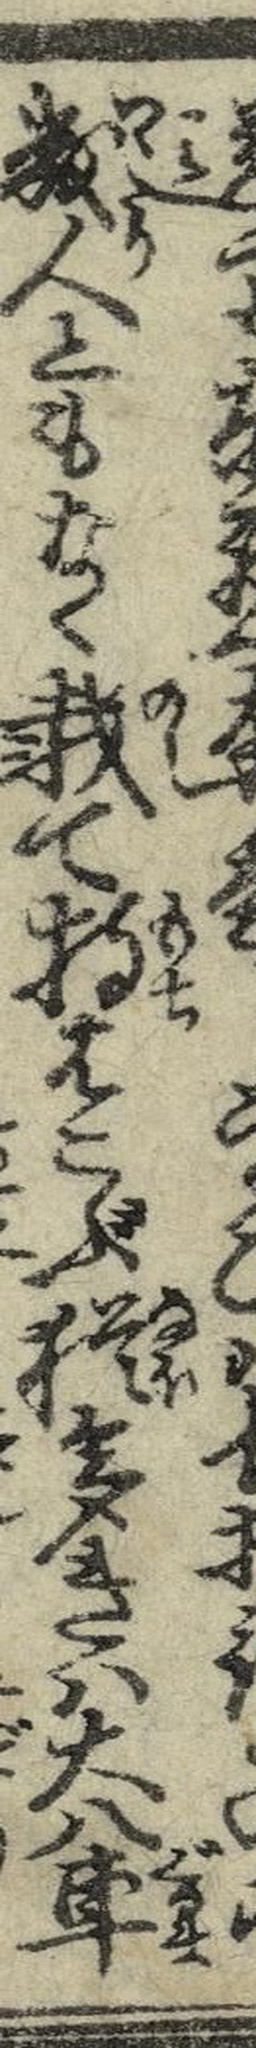幾人ともなく載て持はこぶ猶多きハ大八車
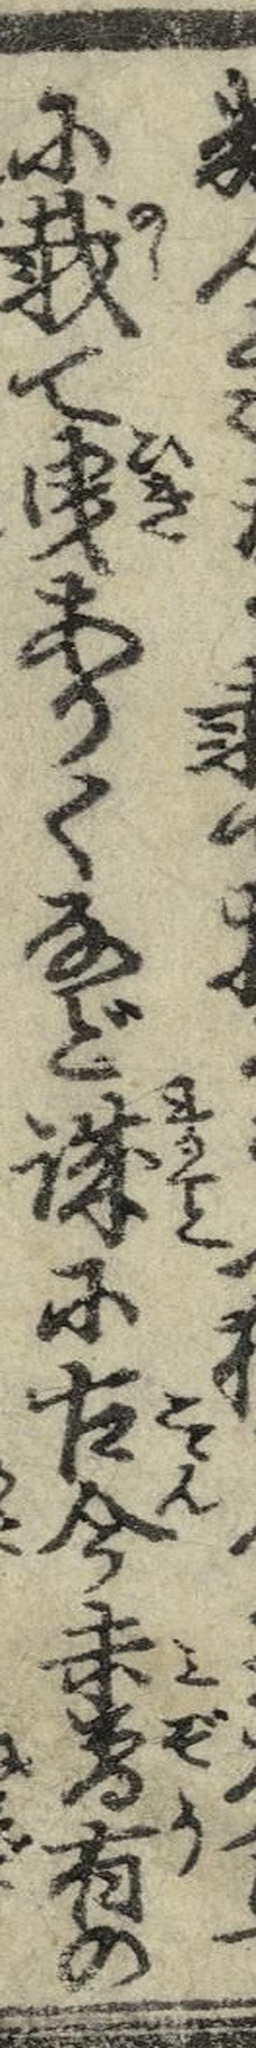に載て曳ありくなど誠に古今未曾有の
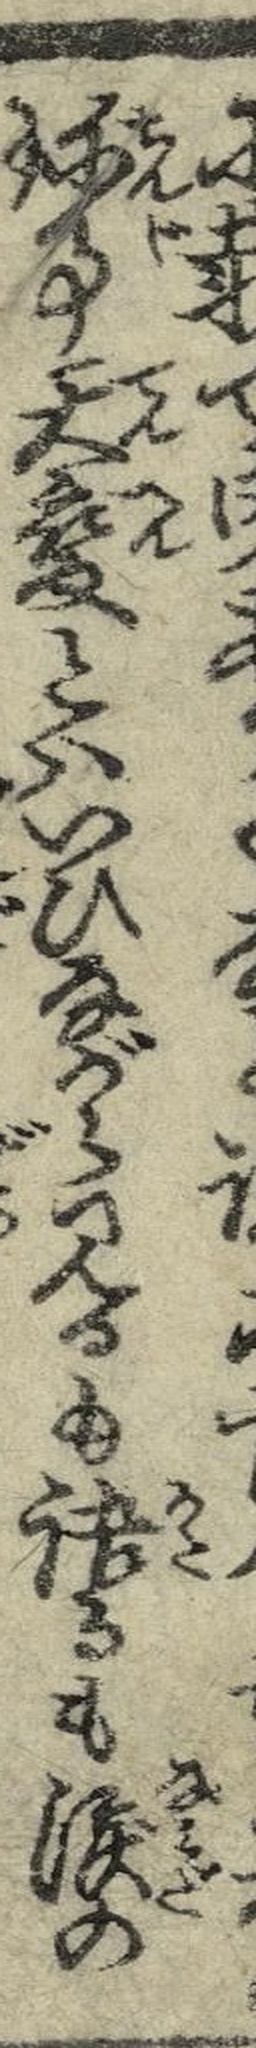珍事天変とハいひながら見るも語るも涙の
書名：地震並出火細見記
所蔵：東京大学地震研究所図書室 Earthquake Research Institute Library, The University of Tokyo, JAPAN
